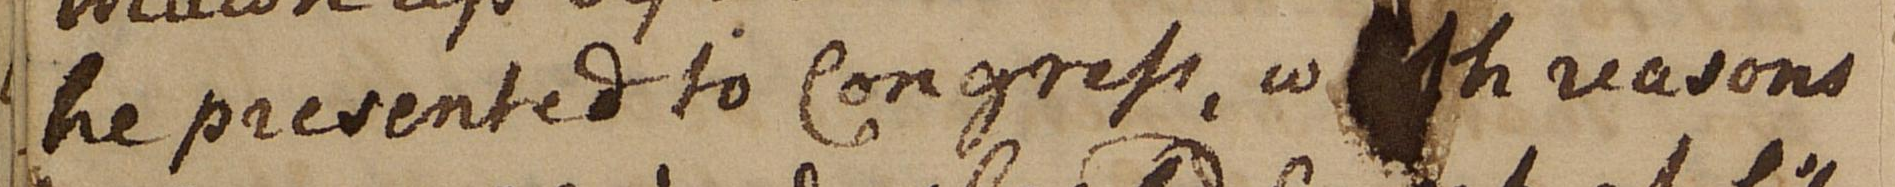he presented to Congress, with reasons
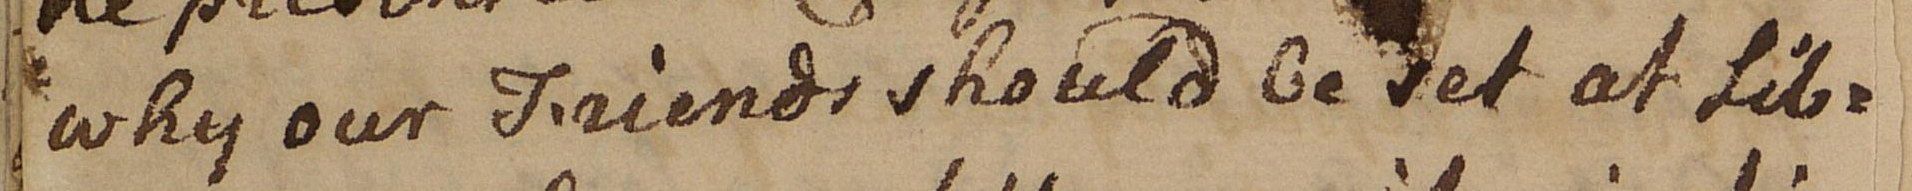why our Friends should be set at Lib-
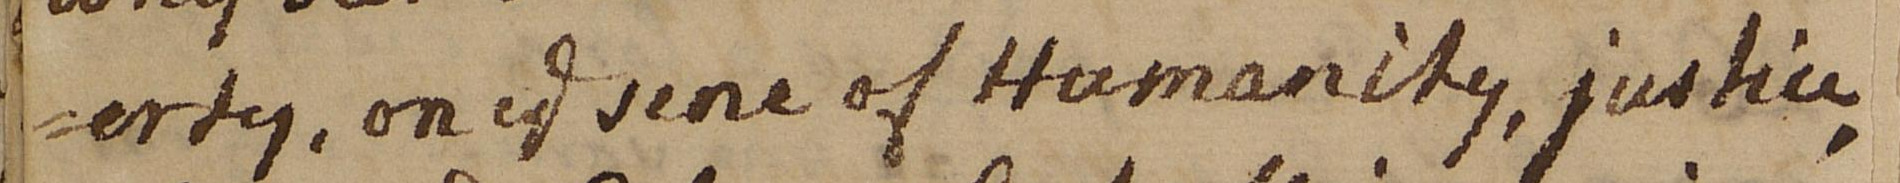-erty, on y^e sene of Humanity, justice,
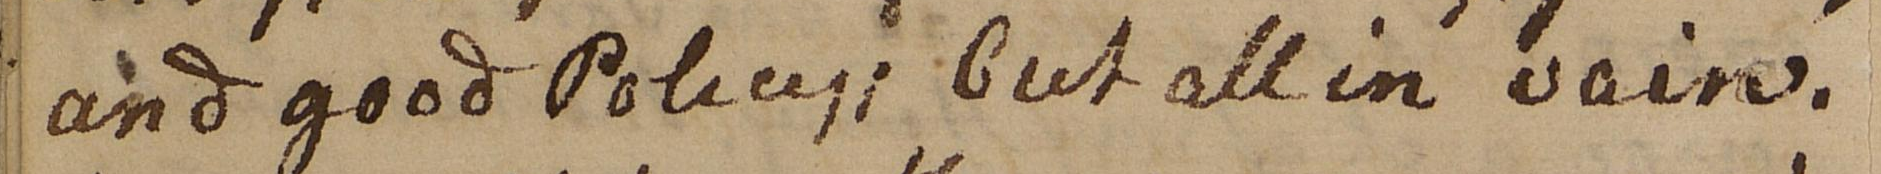and good Policy; but all in vain.
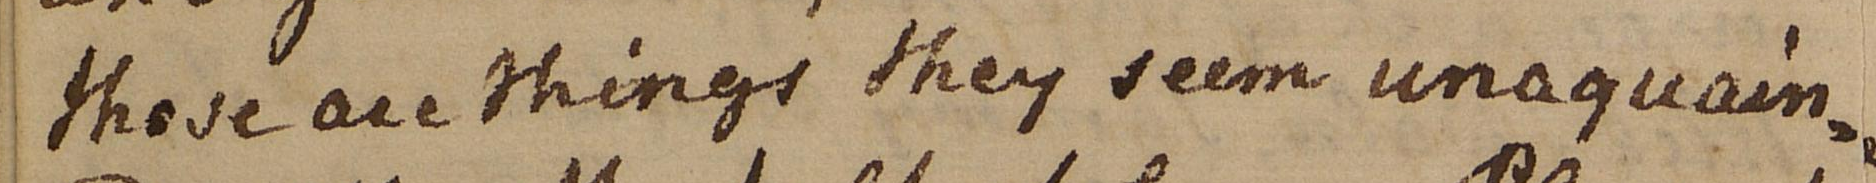those are things they seem unaquain-
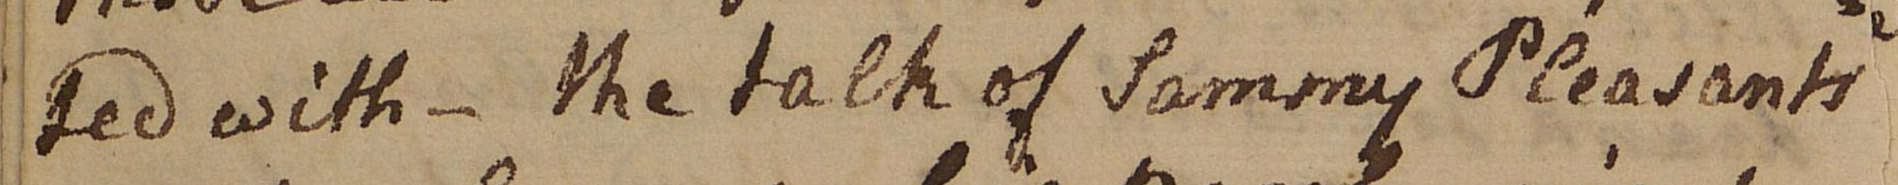ted with- the talk of Sammy Pleasants
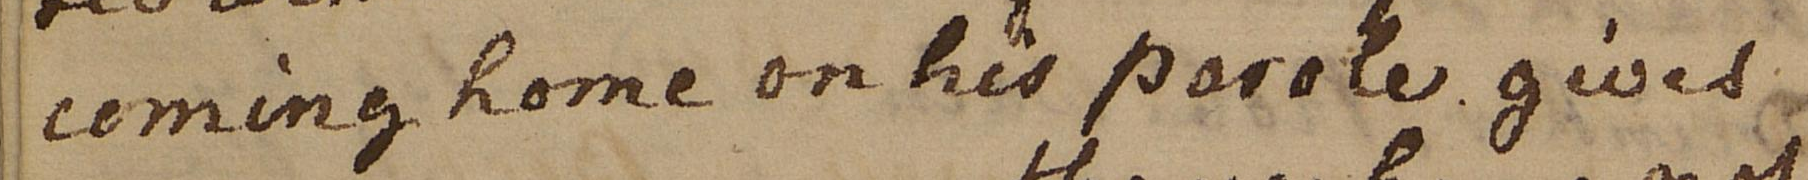coming home on his parole gives
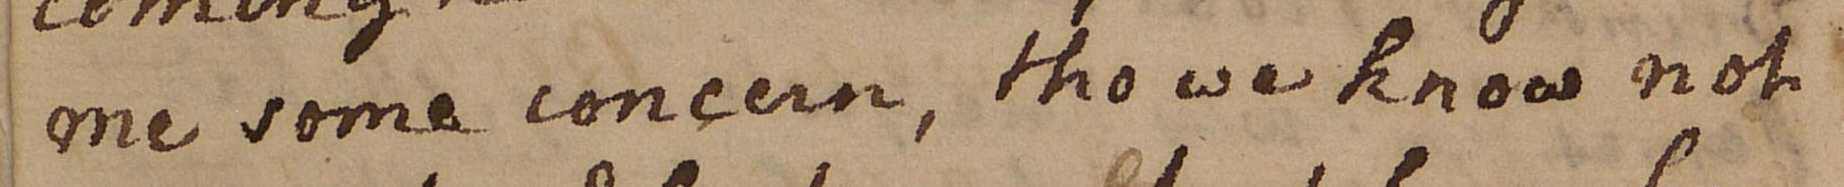me some concern, tho we know not
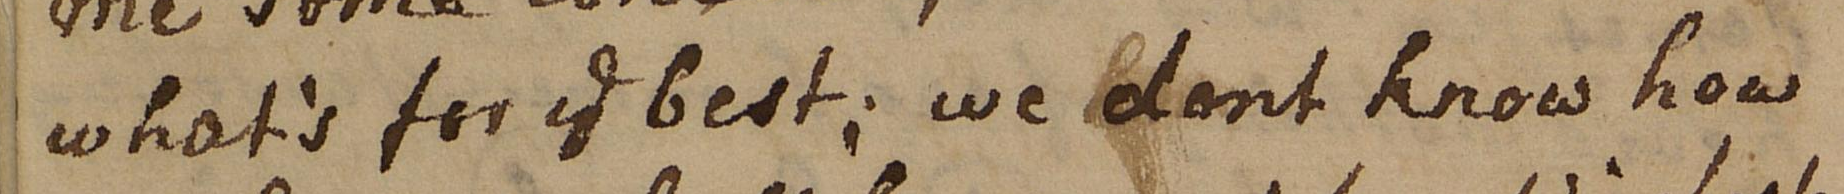what's for y^e best; we dont know how
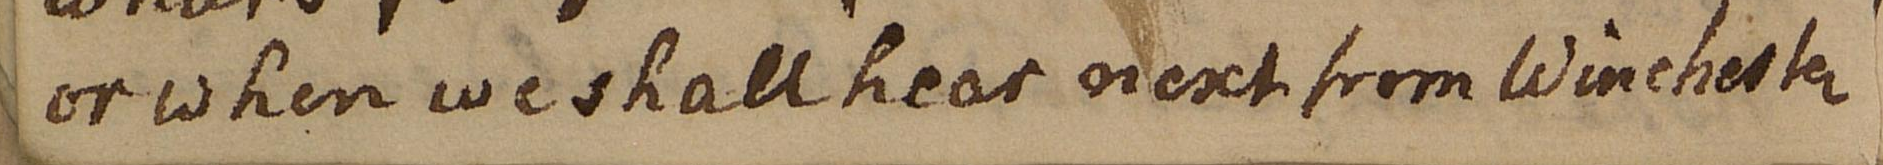or when we shall hear next from Winchester
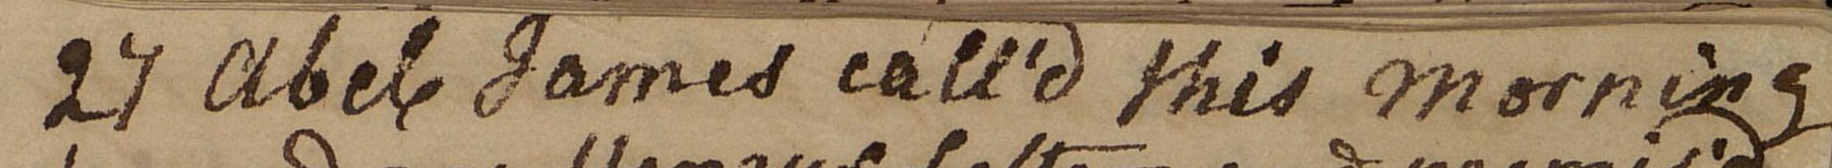27 Abel James call'd this morning
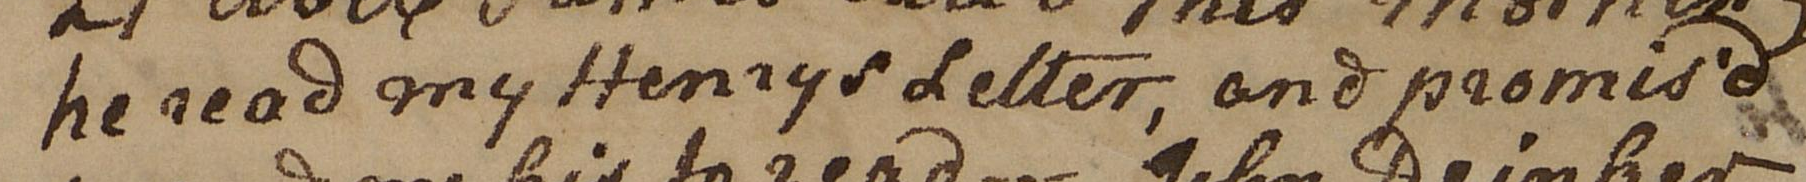he read my Henrys Letter, and promis'd
